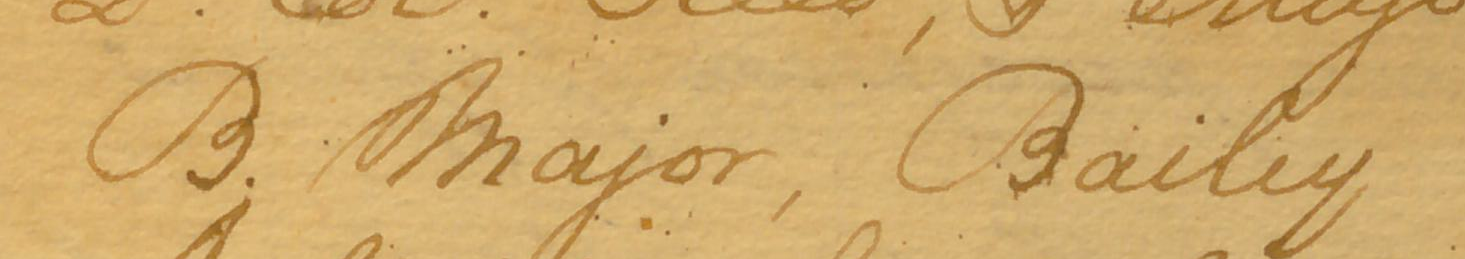B. Major, Bailey
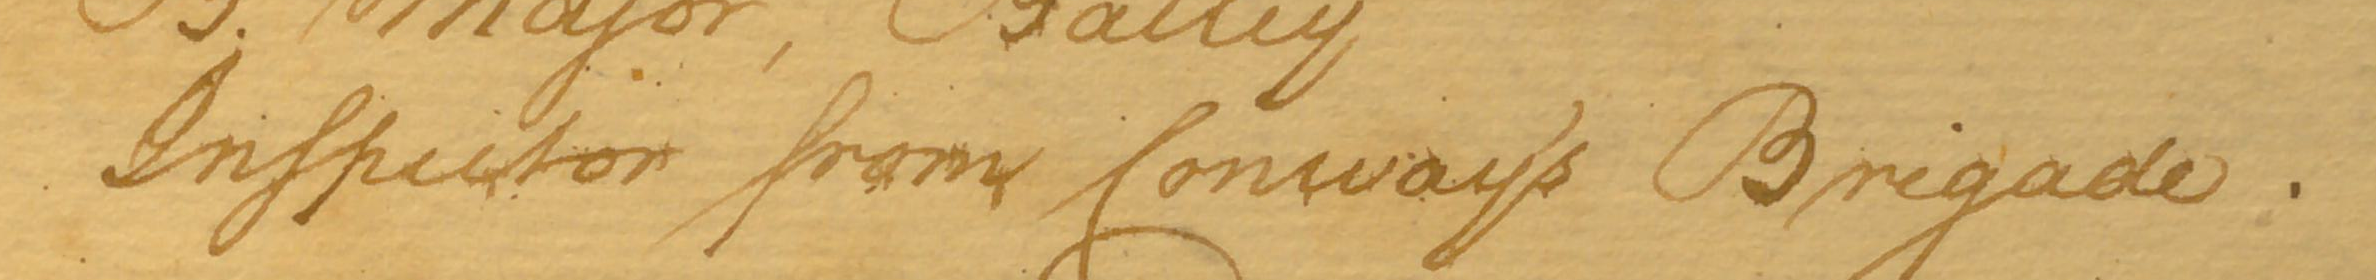Inspector from Conway's Brigade.
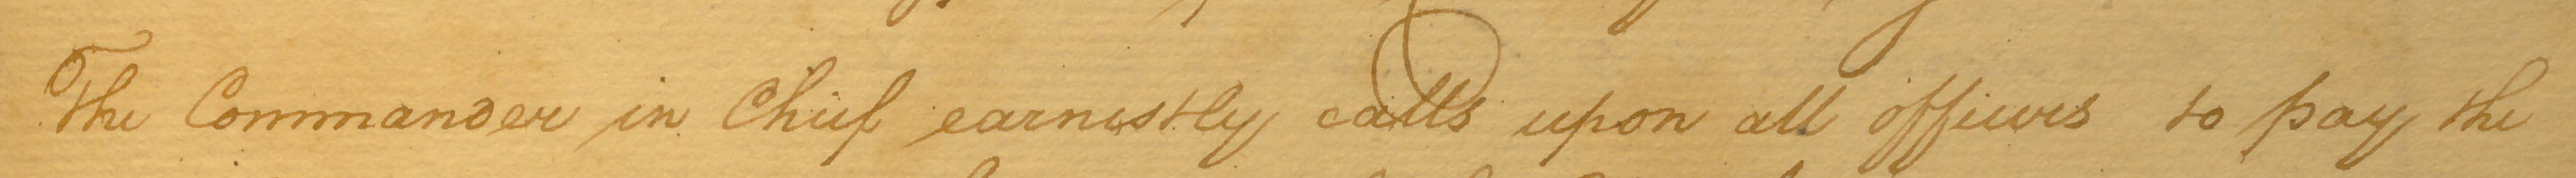The Commander in Chief earnestly calls upon all officers to pay the
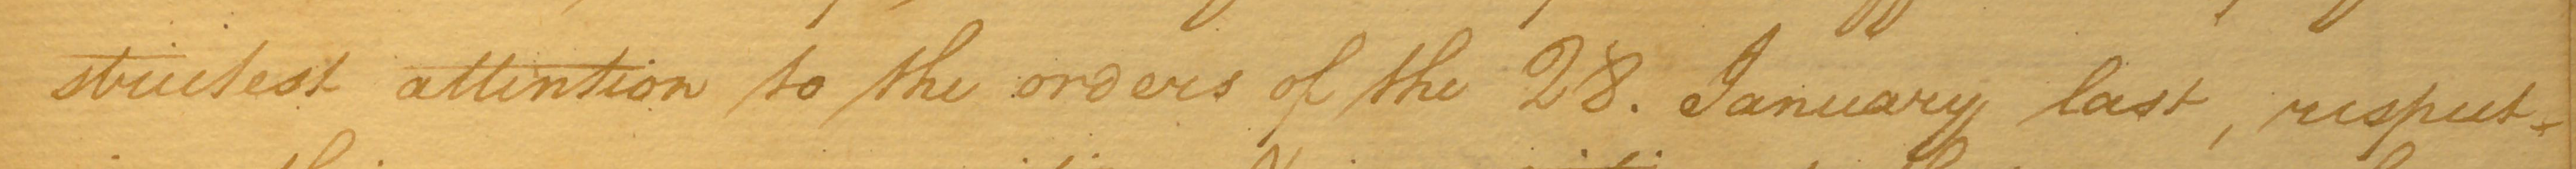strictest attention to the orders of the 28. January last, respect-
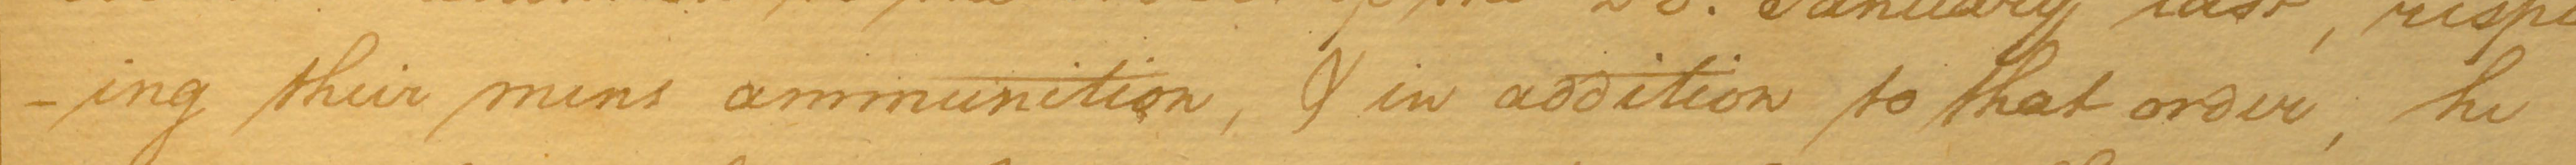-ing their mens ammunition, & in addition to that order, he
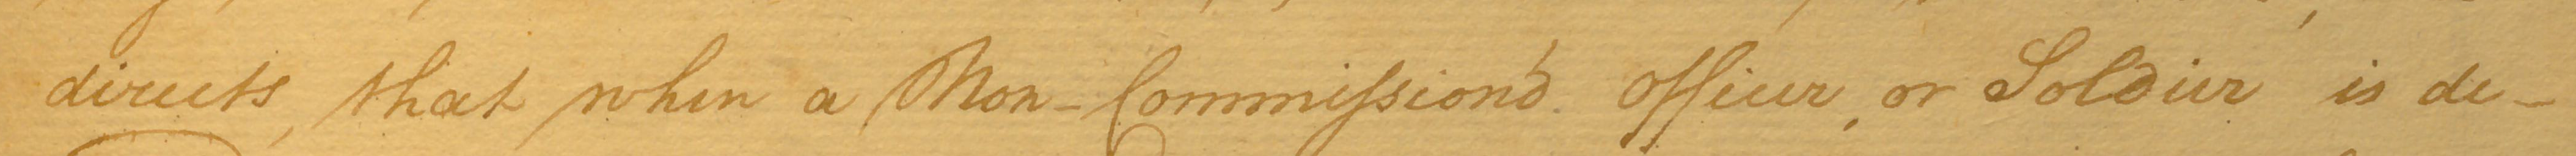directs that when a Non-Commission'd officer, or solder is de-
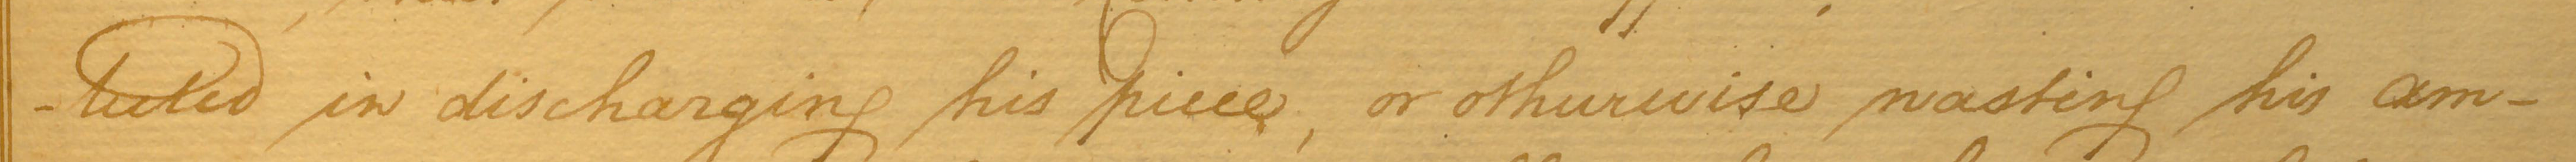-tected in discharging his piece, or otherwise wasting his am-
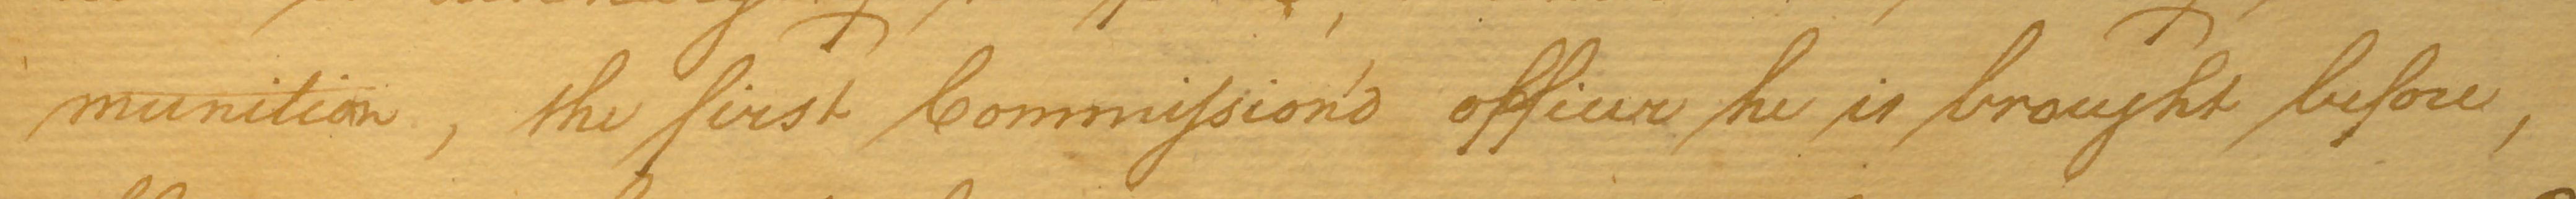munition, the first Commission'd officer he is brought before,
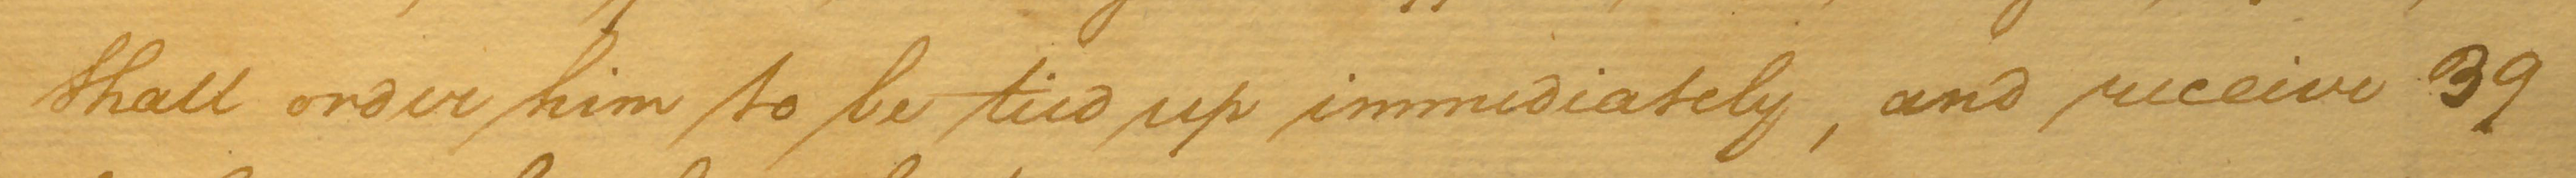shall order him to be tied up immediately, and receive 39
